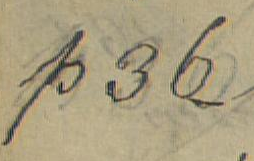p 36
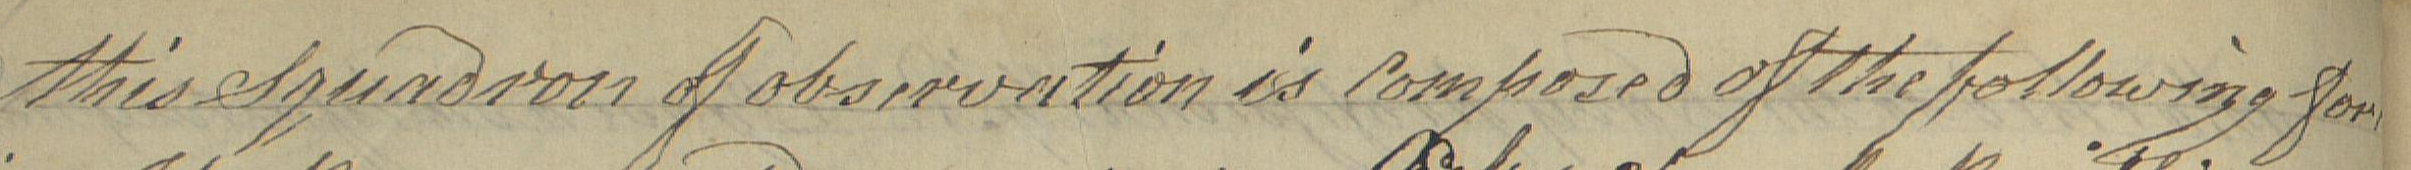this Squadron of observation is composed of the following for-
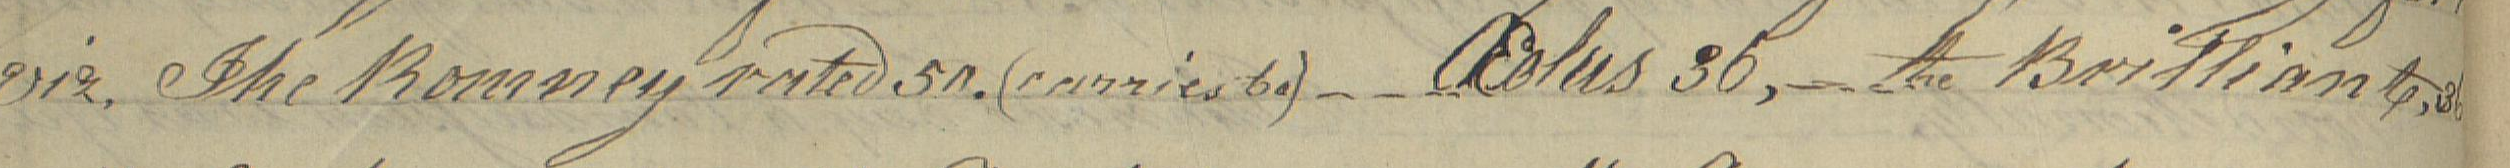viz. The Romney rated 50 (carries 60) Aolus 36, the Brilliant, 36
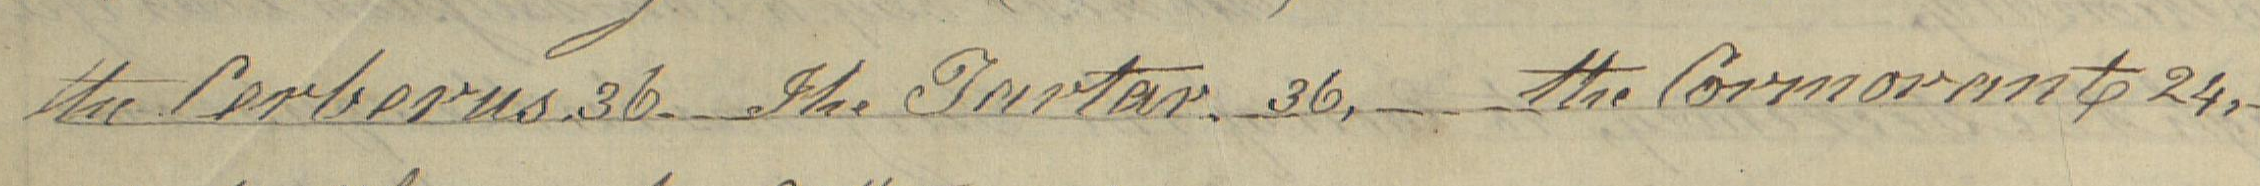the Cerberus 36, The Tartar. 36, the Cormorant 24
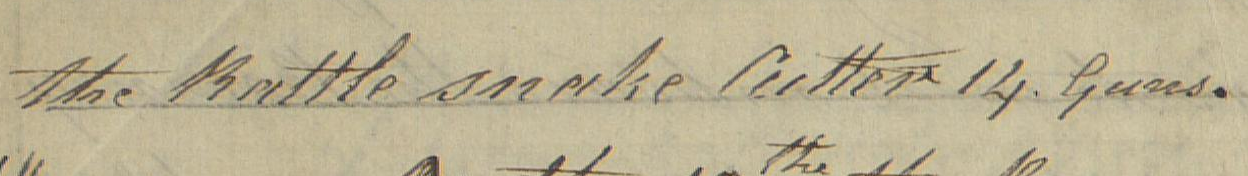the Battle snake Cutter 14 Guns
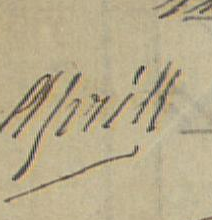Aprill
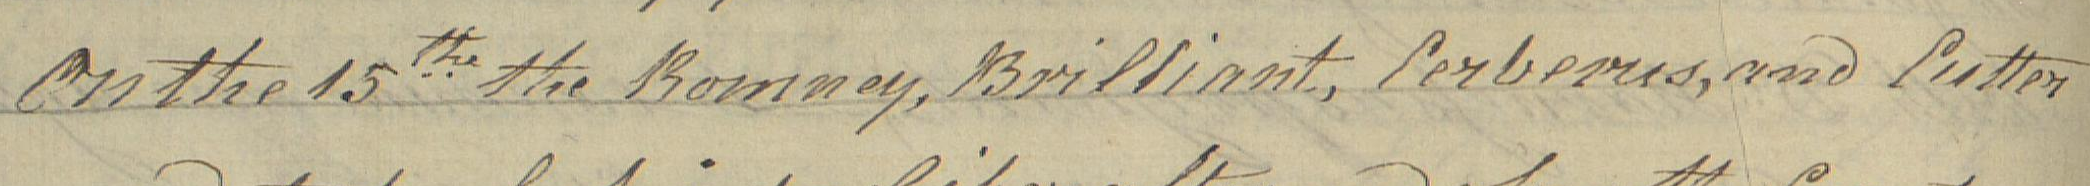On the 15^th. the Romney, Brilliant, Cerberus, and Cutter
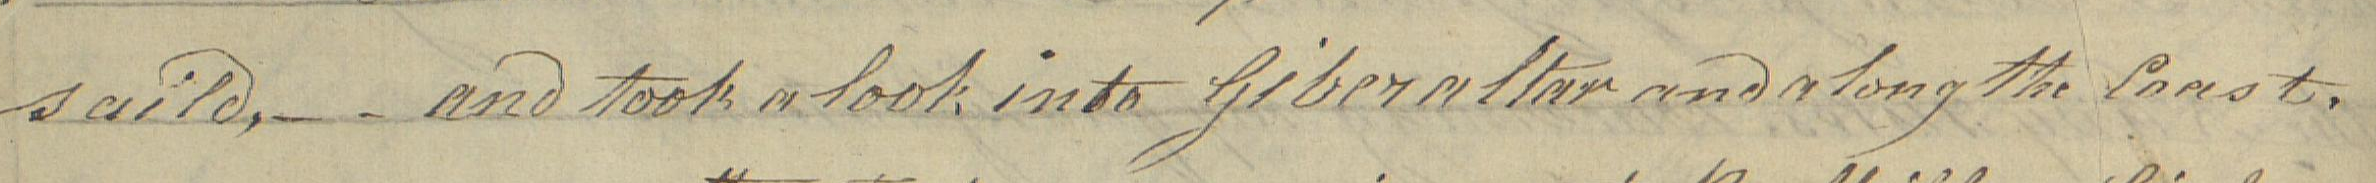saild, and took a look into Giberaltar and along the Coast.
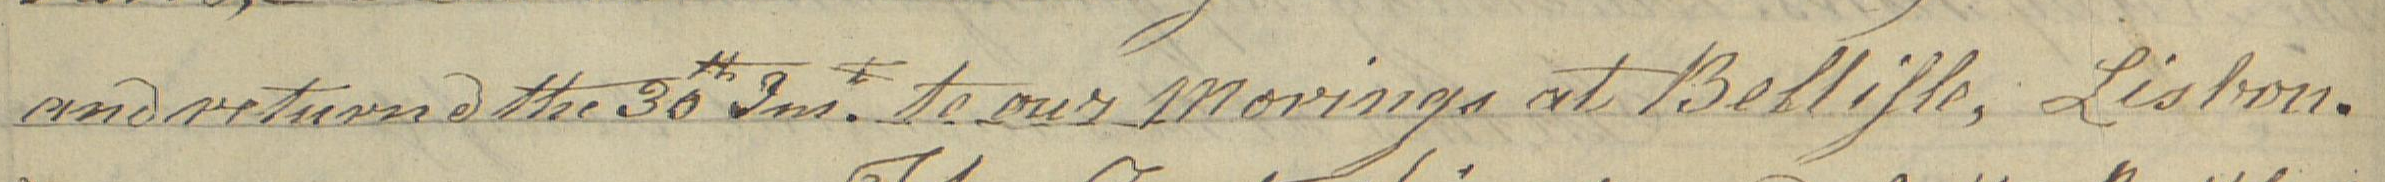and returnd the 30^th Ins^t. to our Morings at Bellisle, Lisbon.
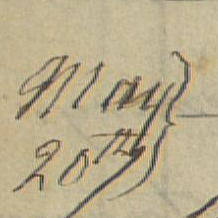May
